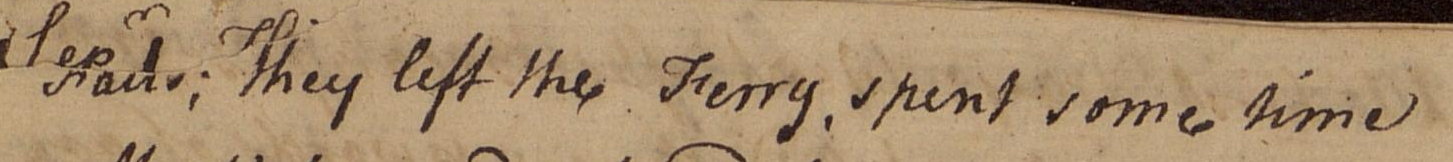[____]; they left the Ferry, spent some time
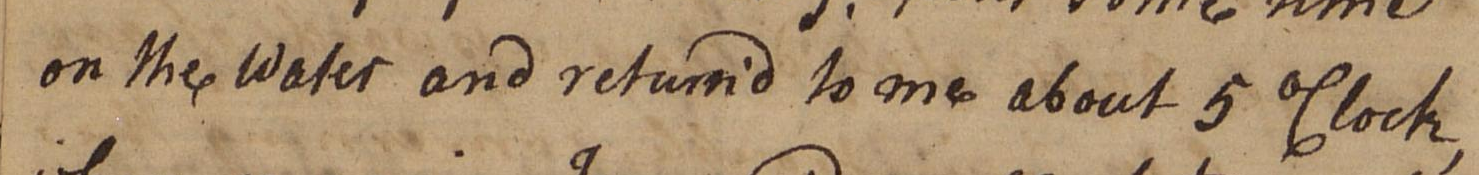on the Water and return'd to me about 5 oClock,
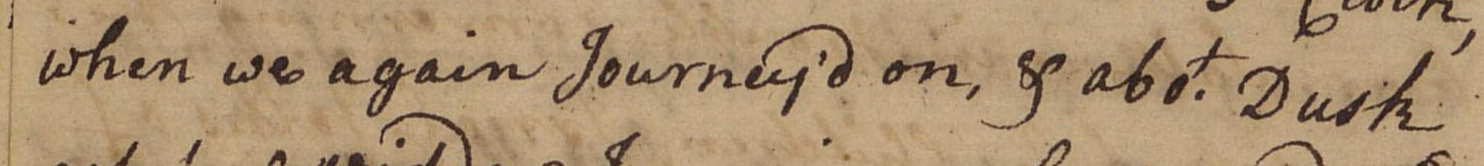when we again Journey'd on, & abo^t. Dusk
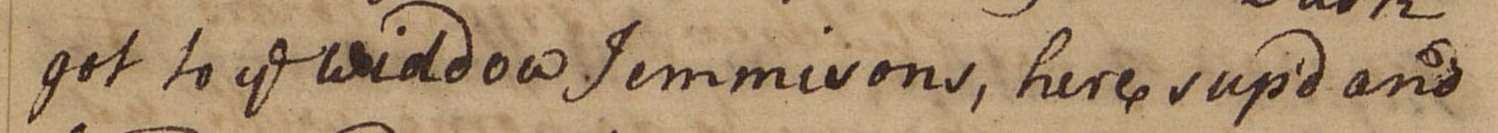get to y^e widdow Jemmisons, here sup'd and
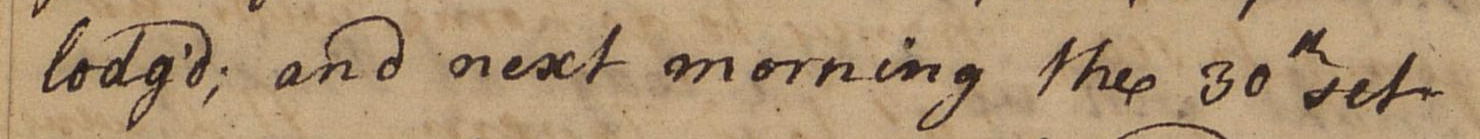lodg'd; and next morning the 30^th set
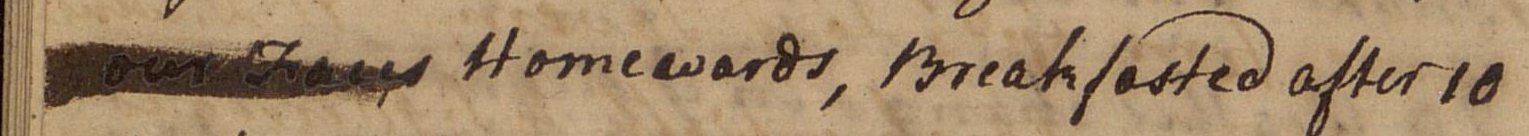our Faces Homewards, Breakfasted after 10
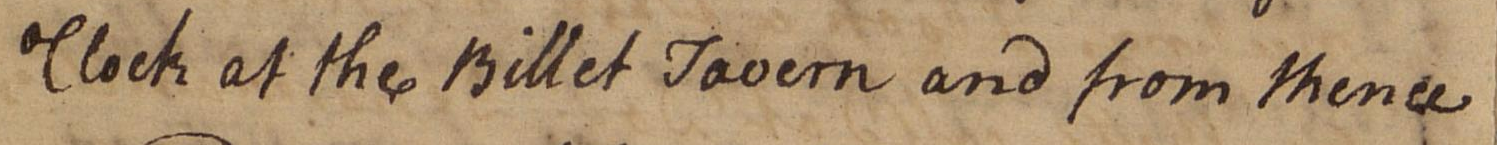oClock at the Billet Tavern and from thence
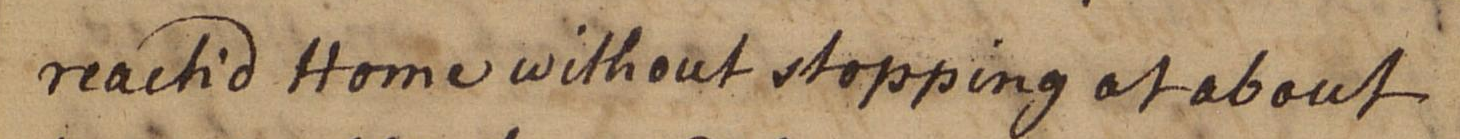reach'd Home without stopping at about
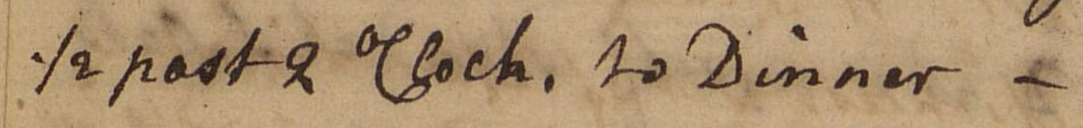1/2 past 2 oClock. to Dinner-
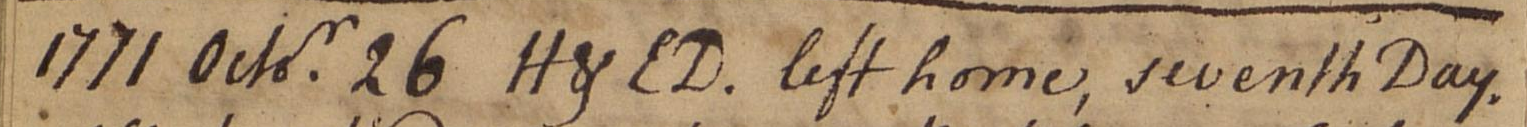1771 Octo^r. 26 H & ED. left home, seventh Day,
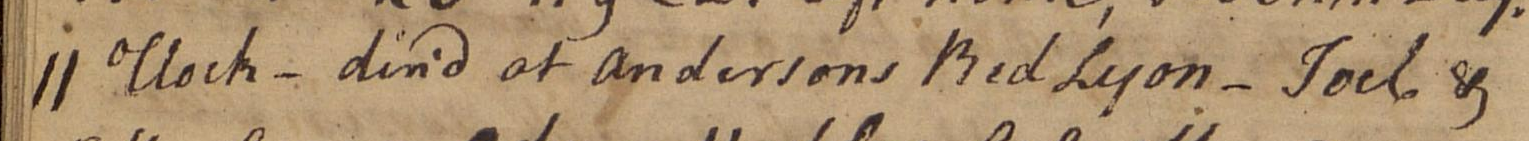11 oClock - din'd at Andersons Red Lyon- Joel &
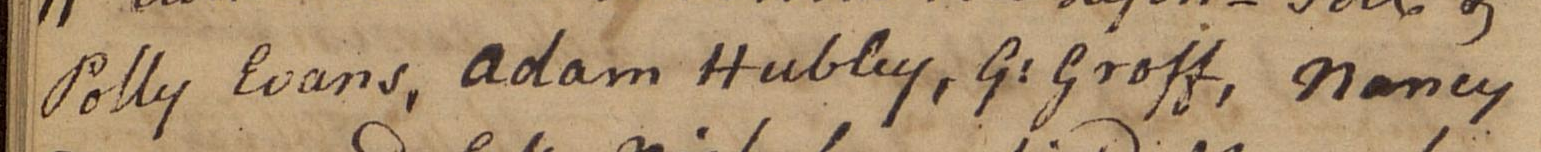Polly Evans, Adam Hubley, G: Groff, Naney
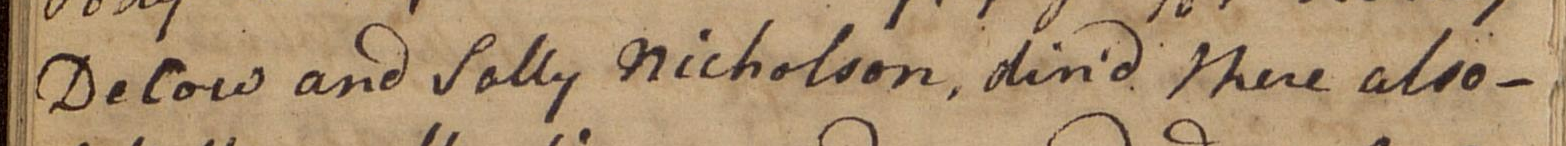Delow and Sally Nicholson, din'd there also-
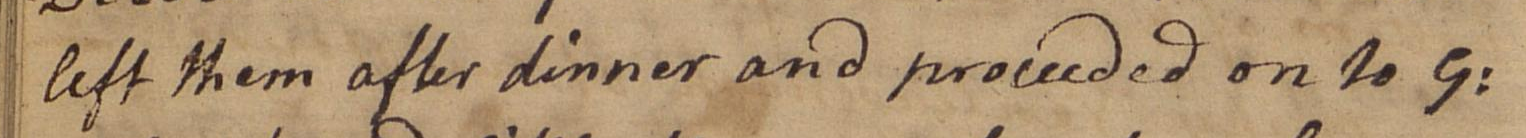left them after dinner and proceeded on to G:
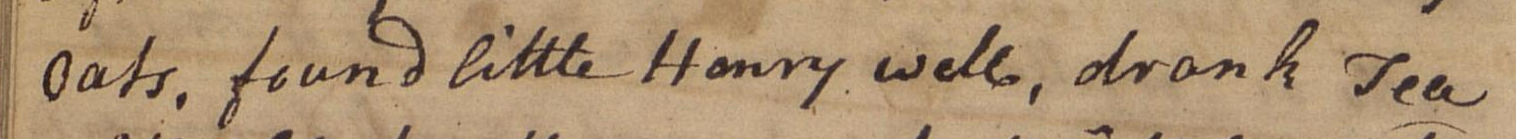Oats, found little Henry well, drank Tea
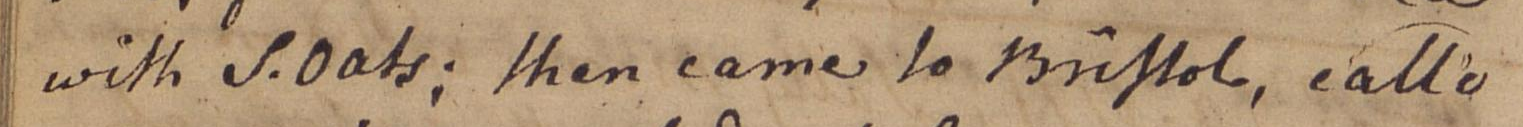with S. Oats; then came to Bristol, call'd
